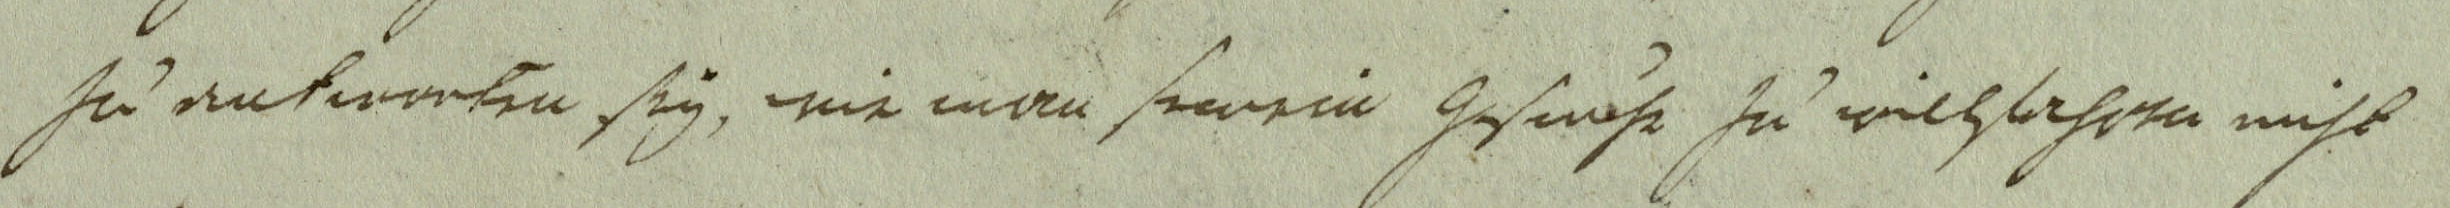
zu antworten seÿ, wie man seinem Gesuche zu willfahren nicht
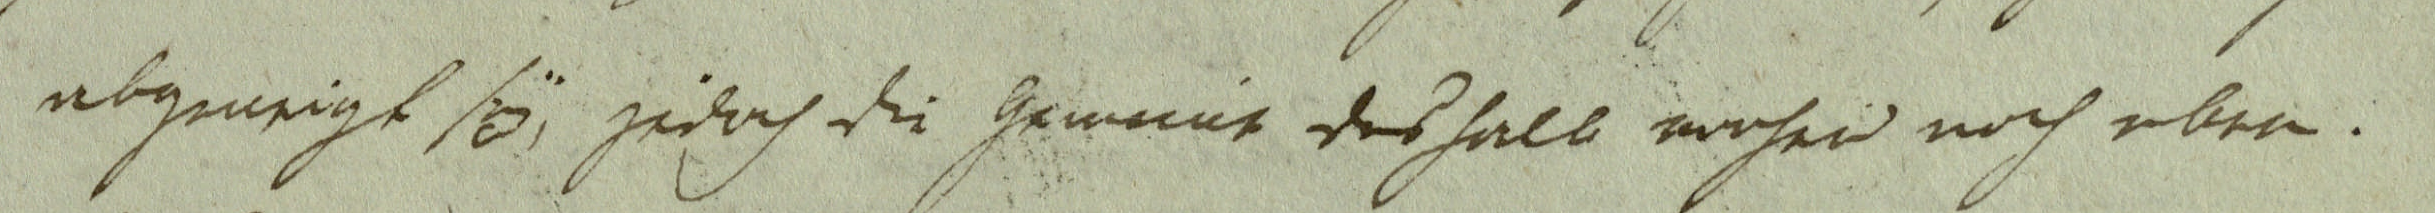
abgeneigt seÿ, jedoch die Gemeine deshalb vorher noch eben¬
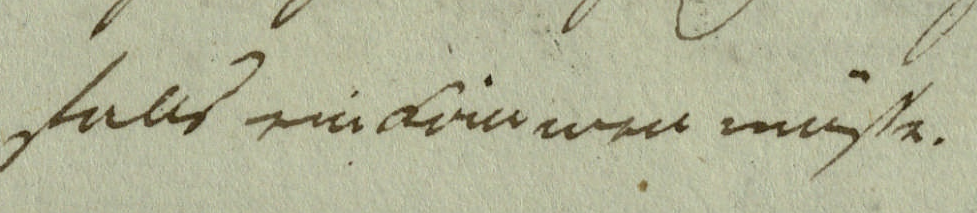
falls einkommen müsse.
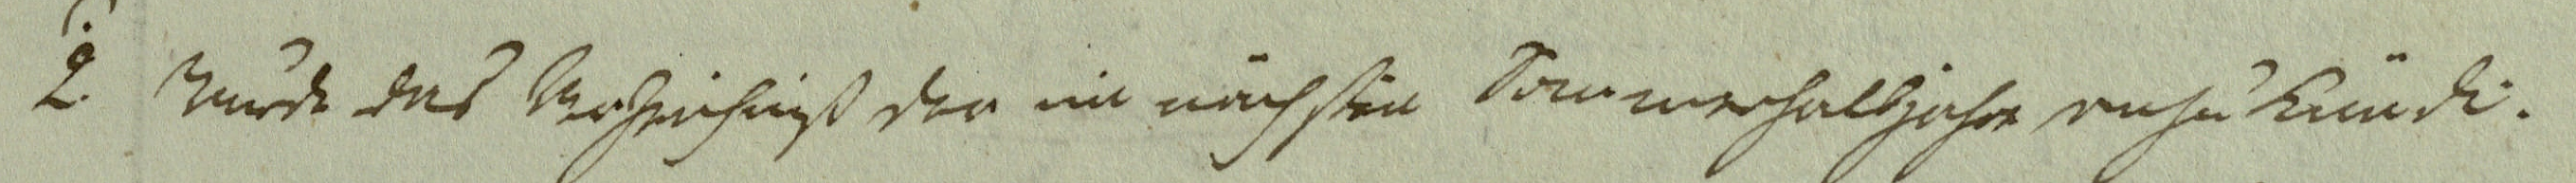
2. Wurde das Verzeichniß der im nächsten Sommerhalbjahre anzukündi¬
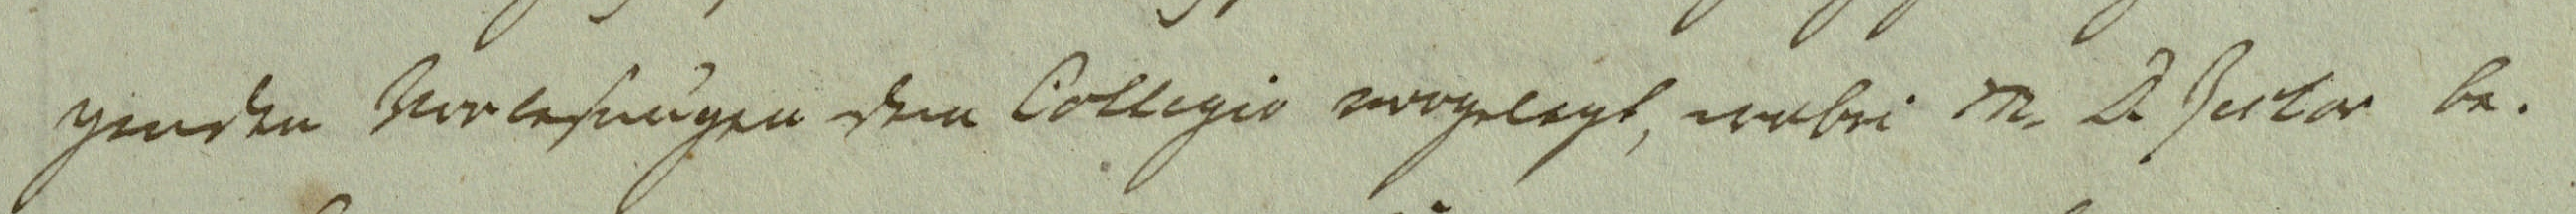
genden Vorlesungen dem Collegio vorgelegt, wobei M. D. Rector be¬
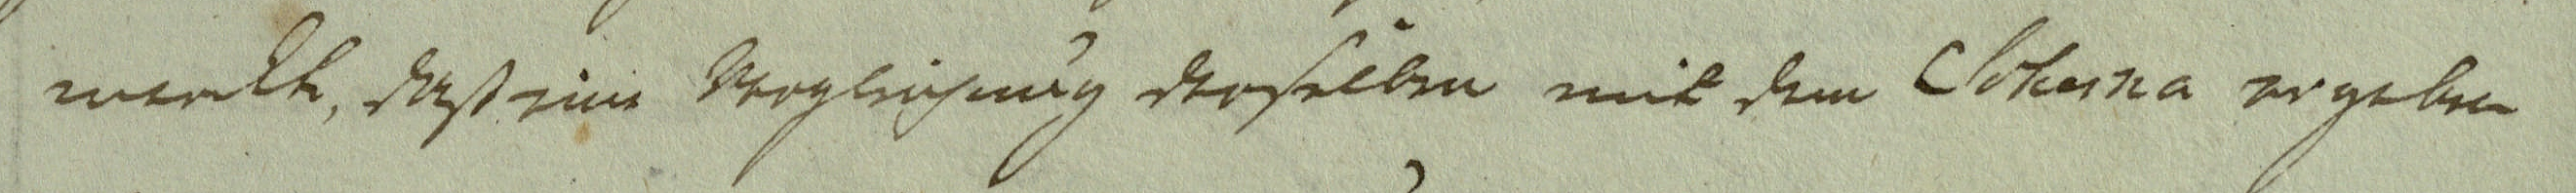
merckte, daß eine Vergleichung derselben mit dem Schema ergeben
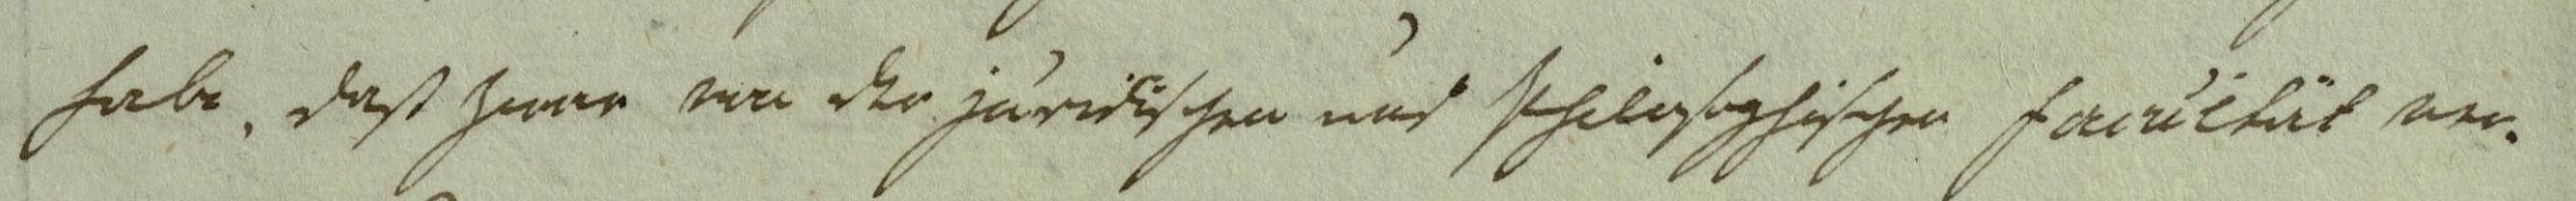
habe, daß zwar von der juridischen und Philosophischen Facultät ver¬
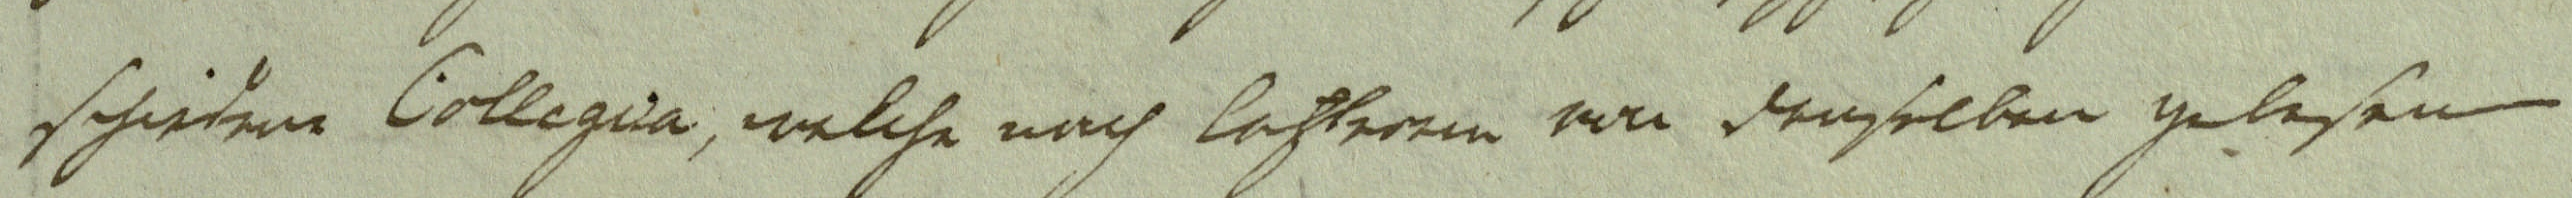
schiedene Collegia, welche nach letzteren von denselben gelesen
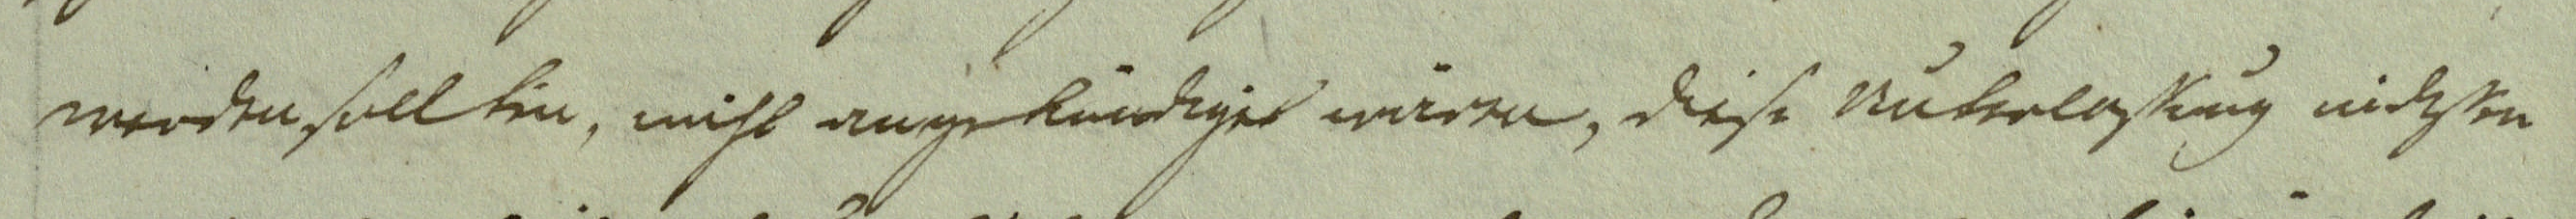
werden sollten, nicht angekündiget wären, diese Unterlassung indessen
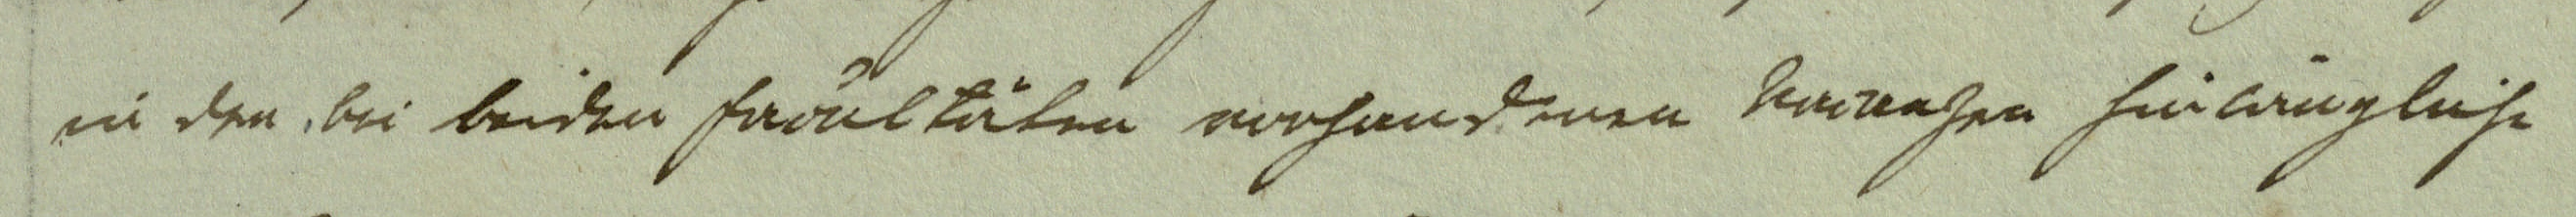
in den bei beiden Facultäten vorhandenen Vacanzen hinlängliche
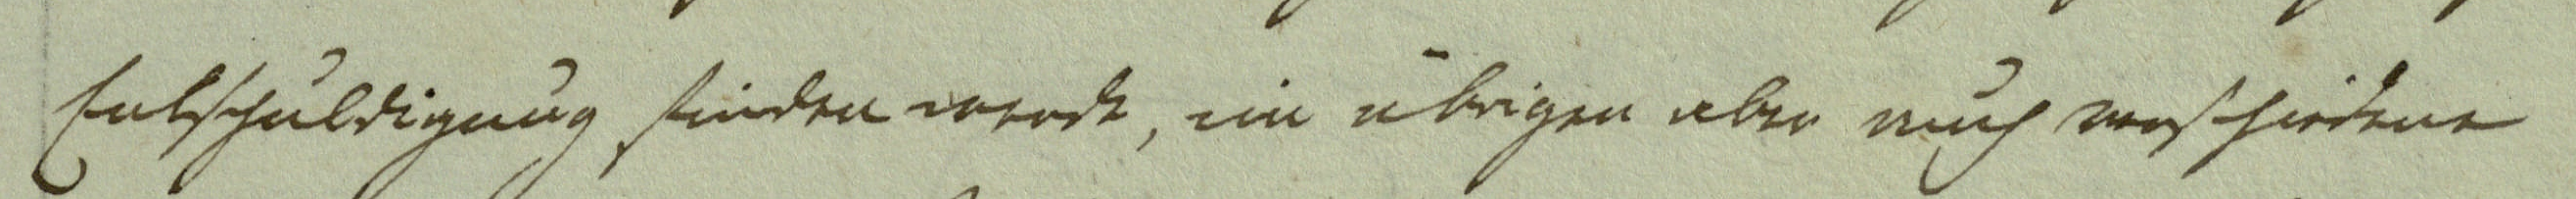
Entschuldigung finden werde, im übrigen aber auch verschiedene
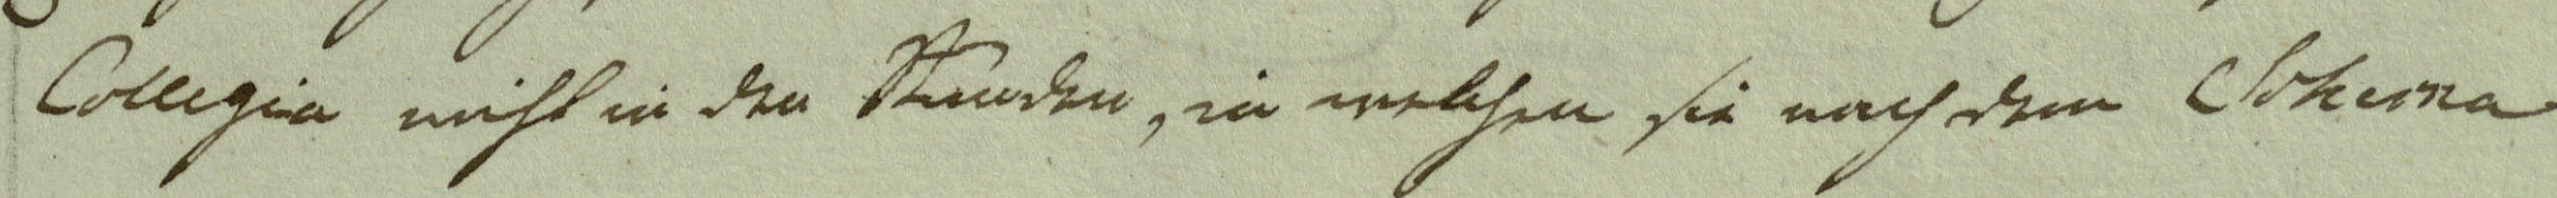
Collegia nicht in den Stunden, in welchen sie nach dem Schema
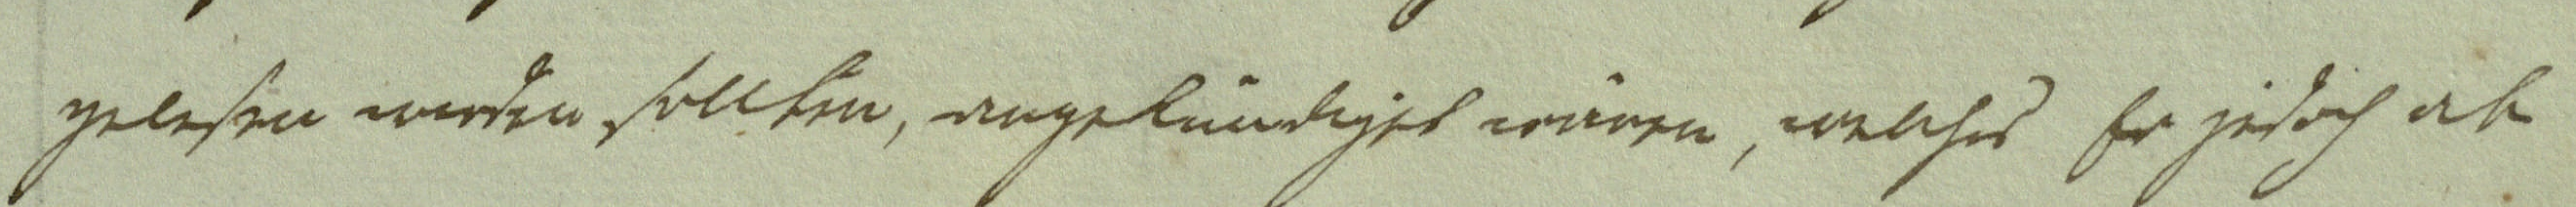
gelesen werden sollten, angekündiget wären, welches Er jedoch ab¬
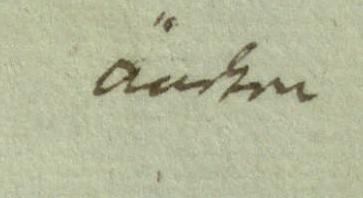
ändern
